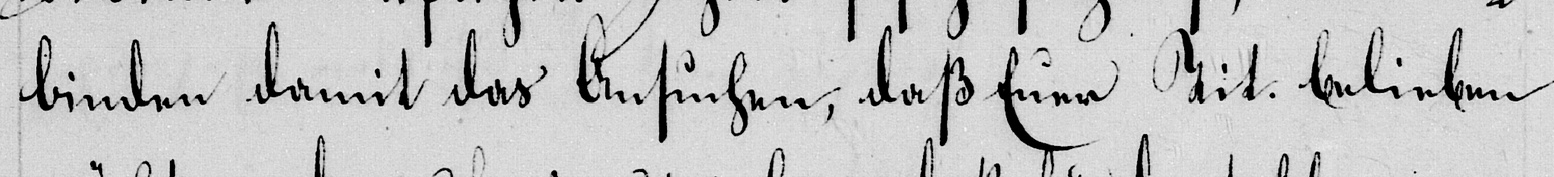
binden damit das Ansuchen, daß Euer Tit. belieben
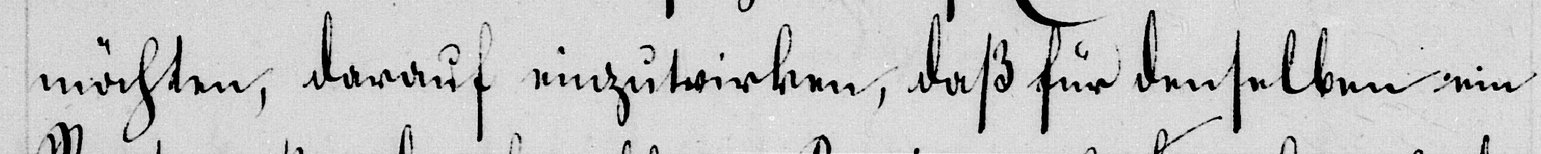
möchten, darauf einzuwirken, daß für denselben ein
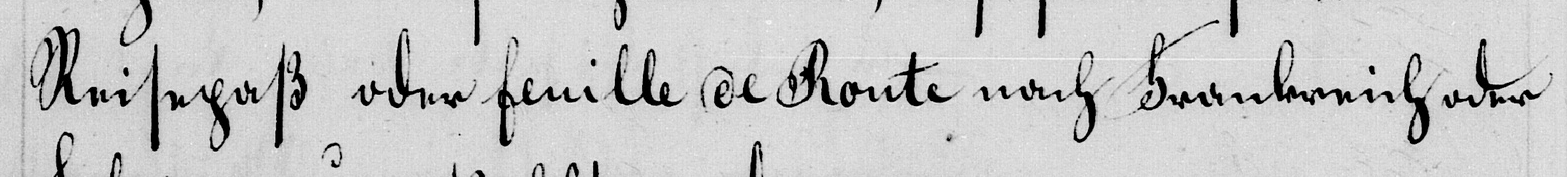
Reisepaß oder feuille de Route nach Frankreich oder
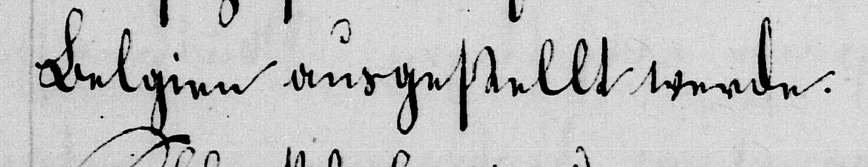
Belgien ausgestellt werde.
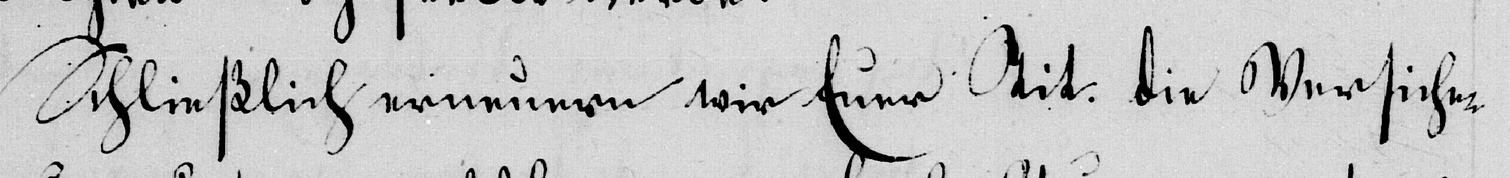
Schließlich erneuern wir Euer Tit. die Versiche¬
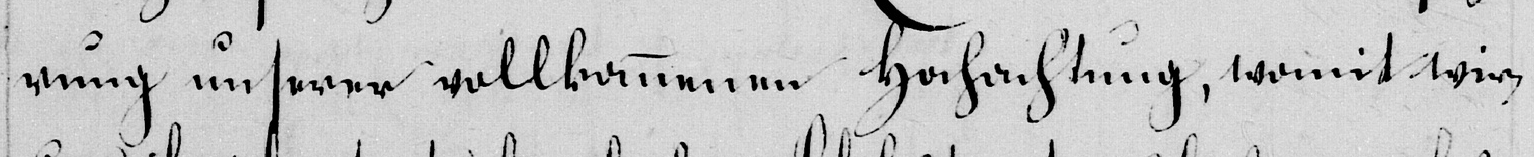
rung unserer vollkommenen Hochachtung, womit wir
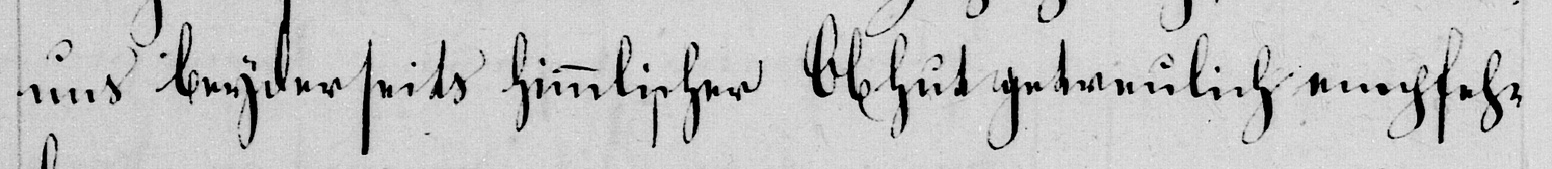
uns beyderseits himmlischer Obhut getreulich empfeh¬
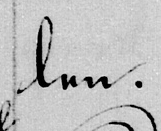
len.
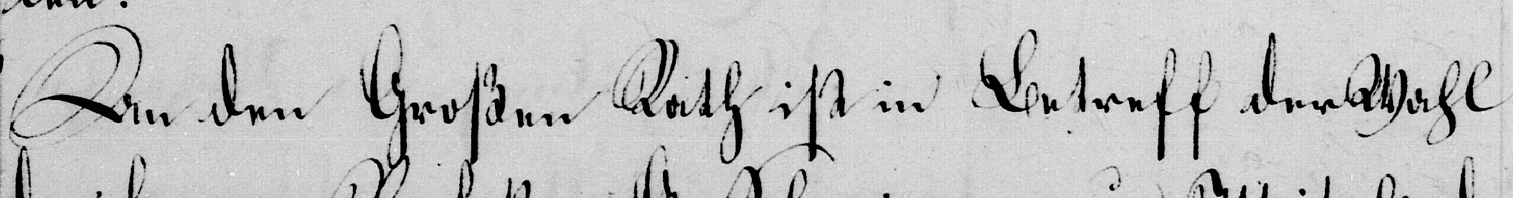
An den Großen Rath ist in Betreff der Wahl
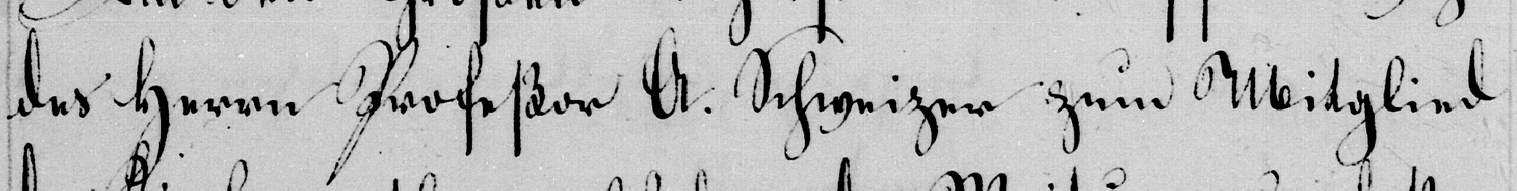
des Herrn Profeßor A. Schweizer zum Mitglied
